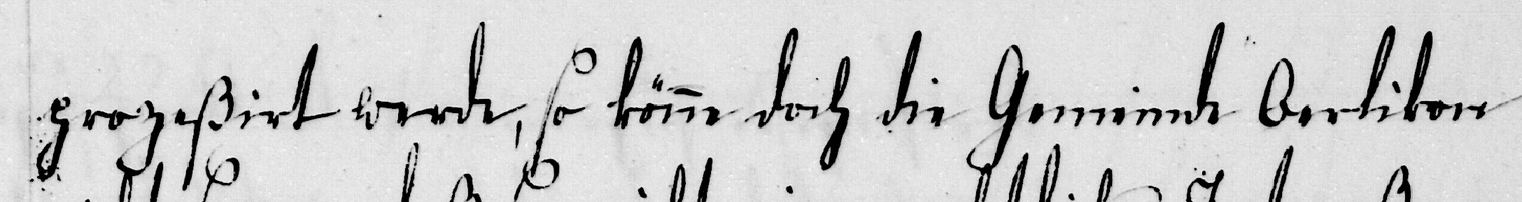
prozeßirt werde, so könne doch die Gemeinde Oerlikon
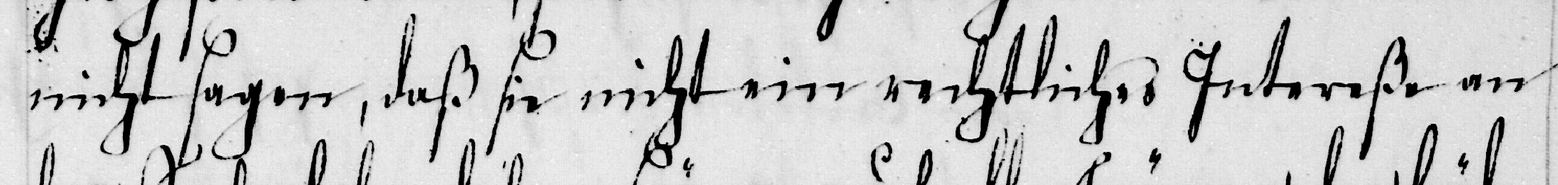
nicht sagen, daß sie nicht ein rechtliches Intereße an
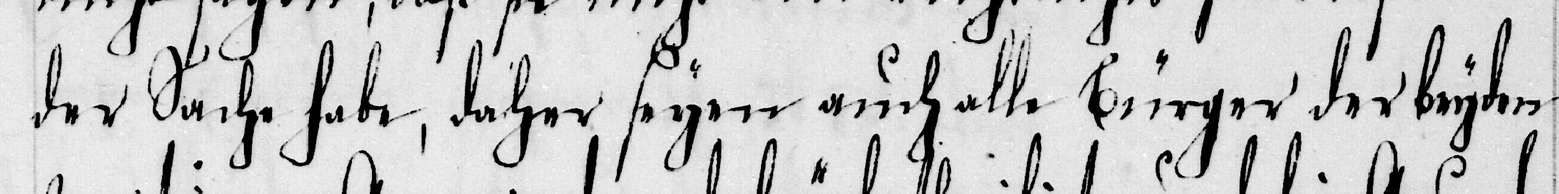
der Sache habe, daher seyen auch alle Bürger der beyden
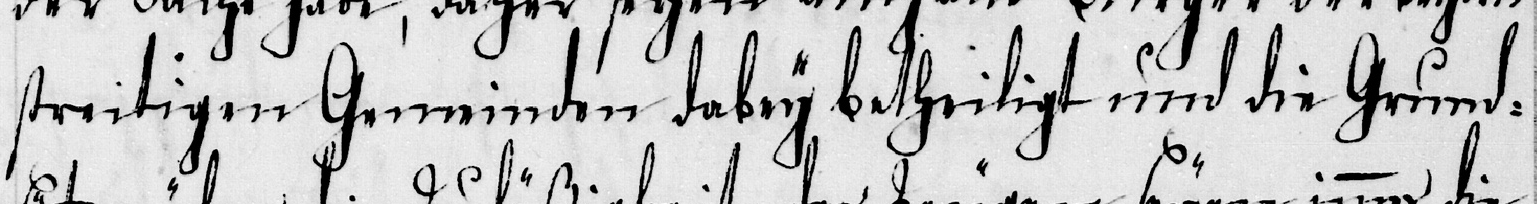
streitigen Gemeinden dabey betheiligt und die Grund¬
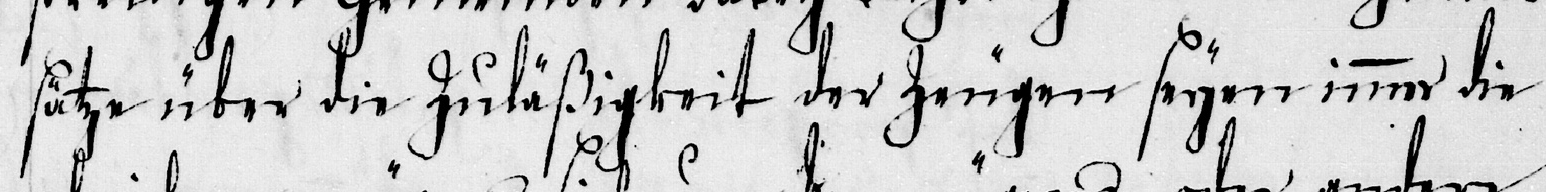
sätze über die Zuläßigkeit der Zeugen seyen immer die
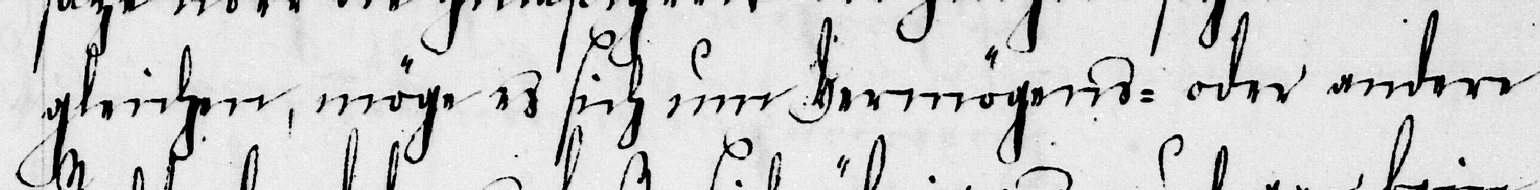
gleichen, möge es sich um Vermögens- oder andere
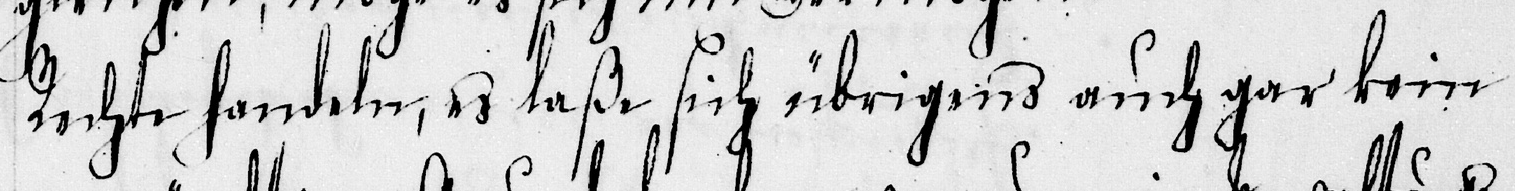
Rechte handeln, es laße sich übrigens auch gar kein
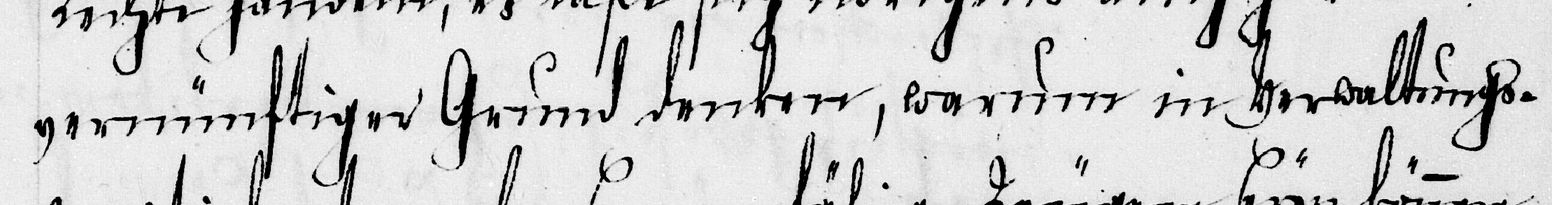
vernünftiger Grund denken, warum in Verwaltungs¬
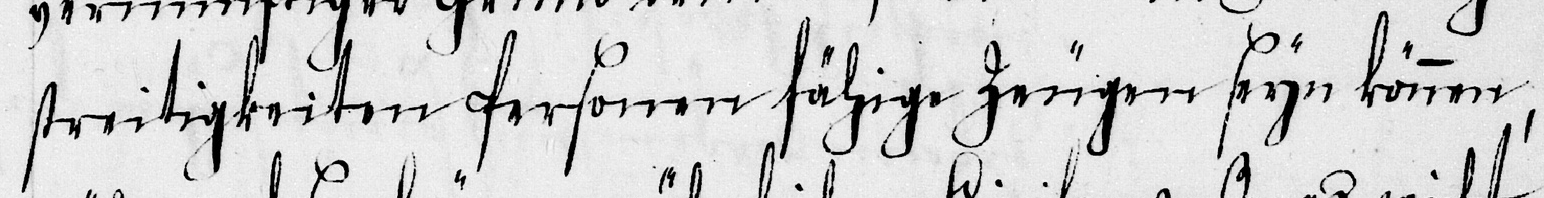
streitigkeiten Personen fähige Zeugen seyn können,
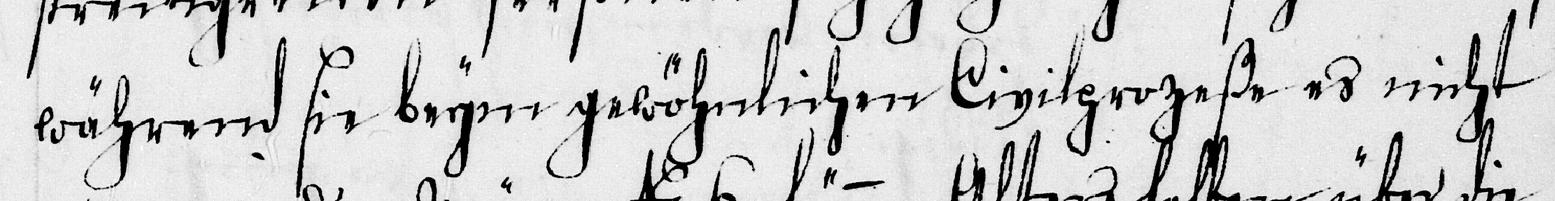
während sie beym gewöhnlichen Civilprozeß es nicht
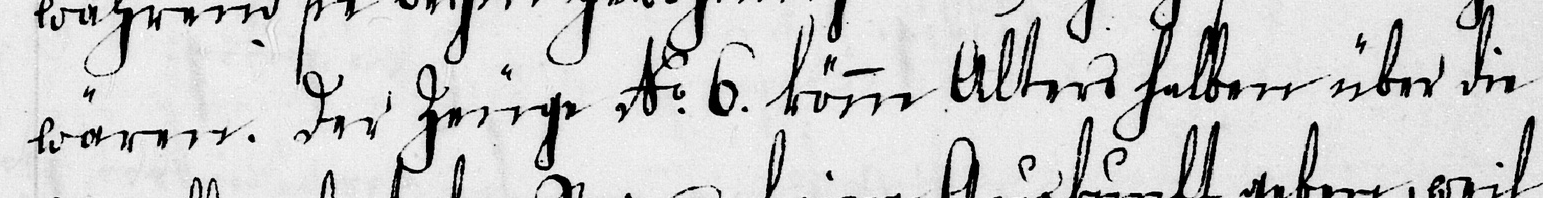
wären. Der Zeuge No. 6. könne Alters halben über die
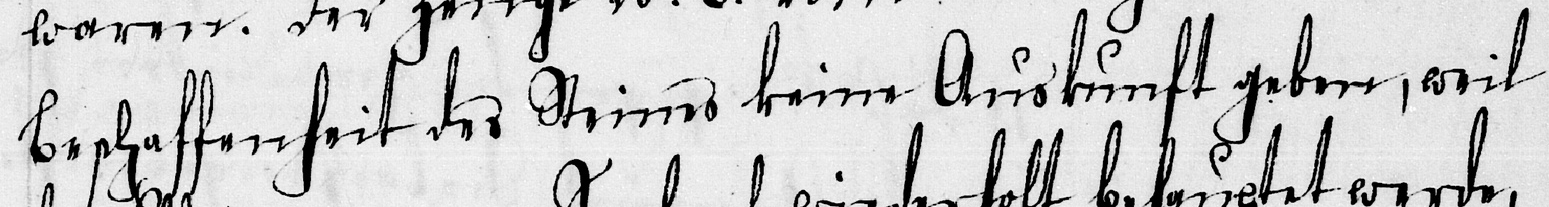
Beschaffenheit des Steines keine Auskunft geben, weil
